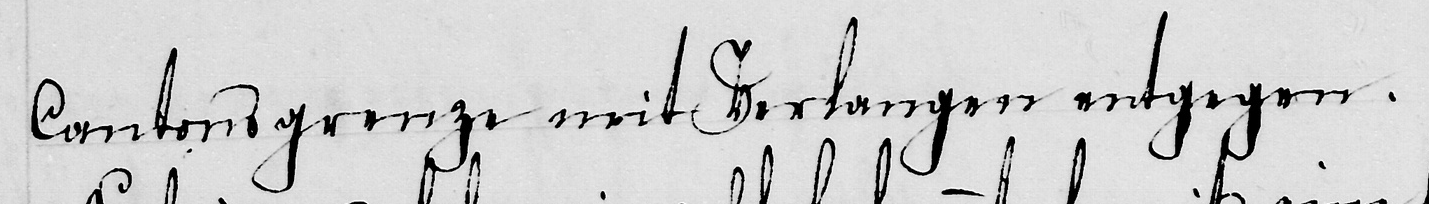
Cantonsgrenze mit Verlangen entgegen.
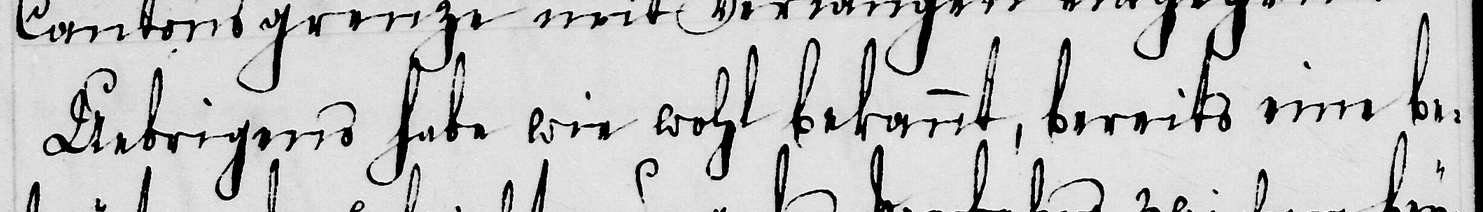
Uebrigens habe wie wohl bekannt, bereits eine be¬
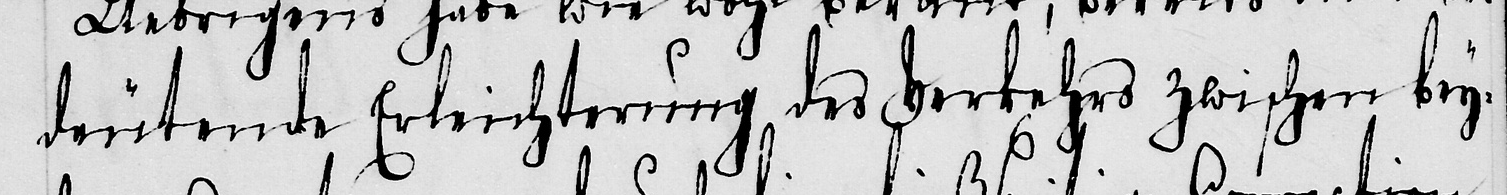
deutende Erleichterung des Verkehrs zwischen bey¬
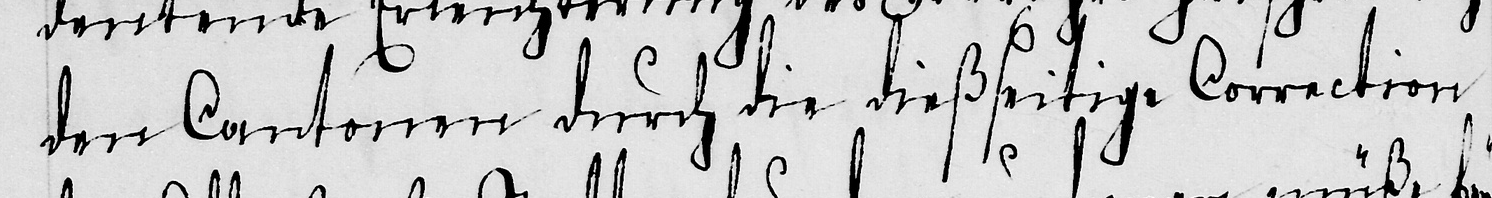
den Cantonen durch die dießseitige Correction
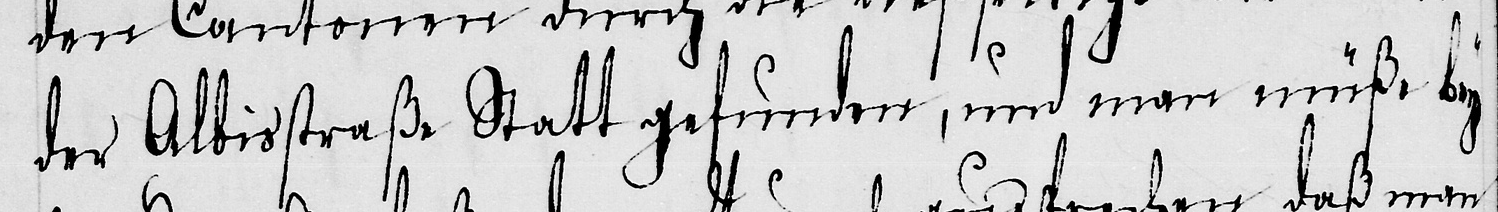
der Albisstraße Statt gefunden, und man müße bey
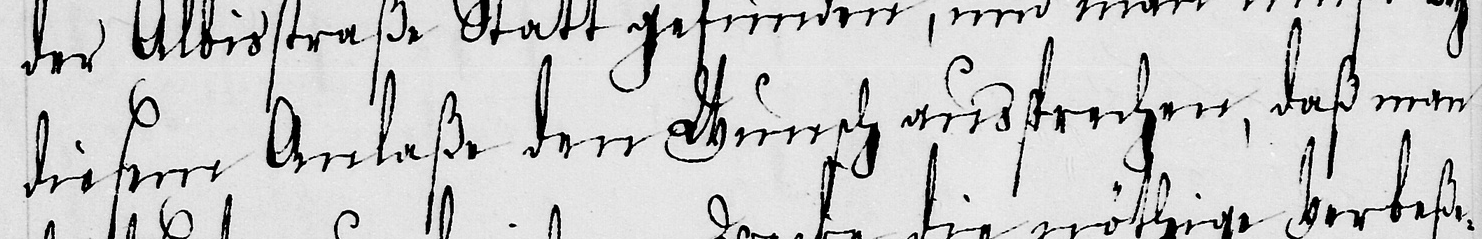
diesem Anlaße den Wunsch aussprechen, daß man
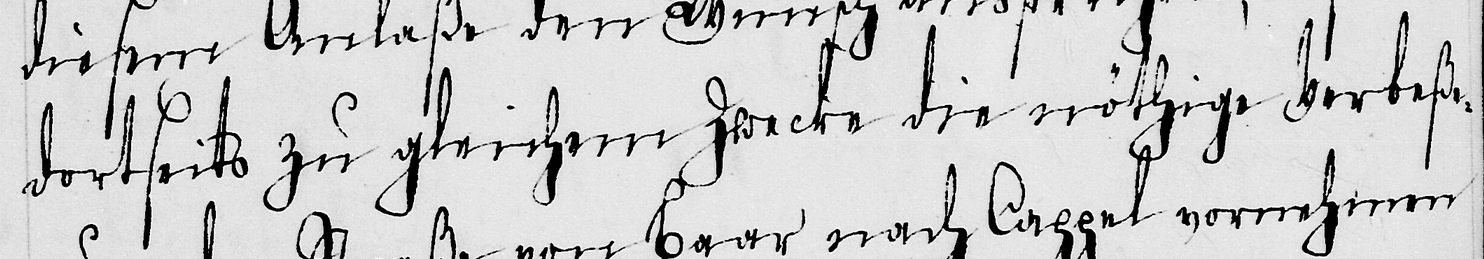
dortseits zu gleichem Zwecke die nöthige Verbeße¬
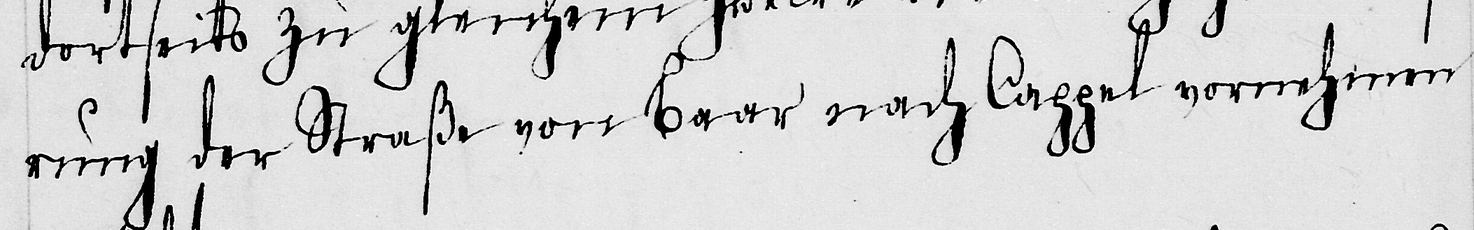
rung der Straße von Baar nach Cappel vornehmen
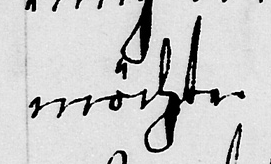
möchte.
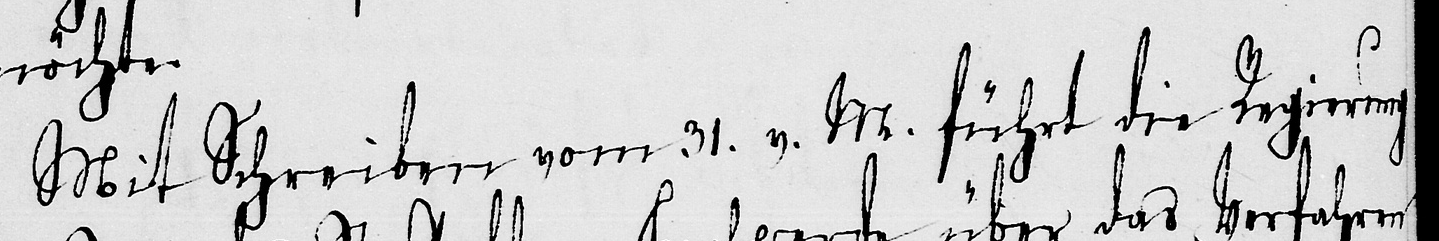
Mit Schreiben vom 31. v. M. führt die Regierung
